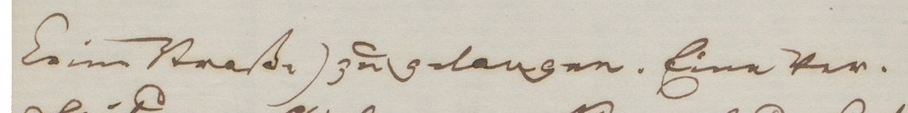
keine Straße) zu gelangen. Eine Ver-
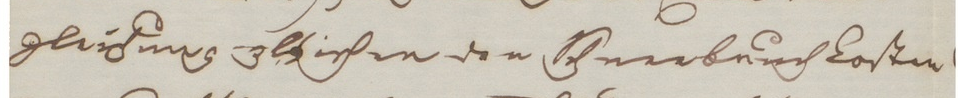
gleichung zwischen den Schneebruchkosten
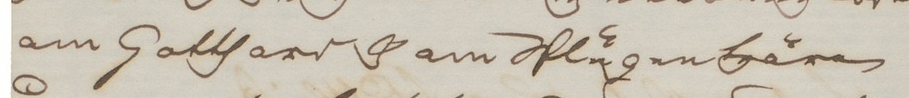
am Gotthard & am Splügen wäre
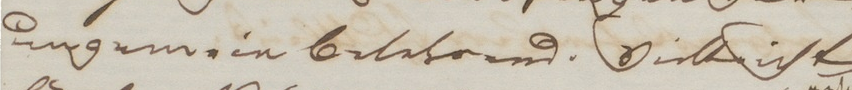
ungemein belehrend. Vielleicht
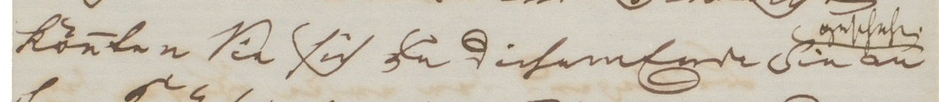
könnten Sie sich zu diesem Ende hin an
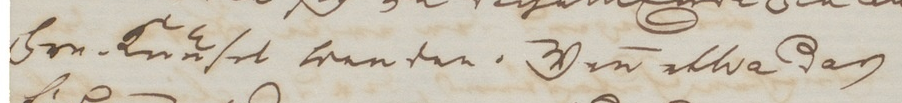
Hrn. Knüsel wenden. Wenn etwa das
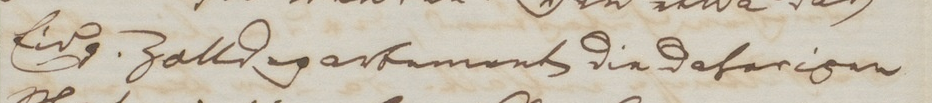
Eidg. Zolldepartement die daherigen
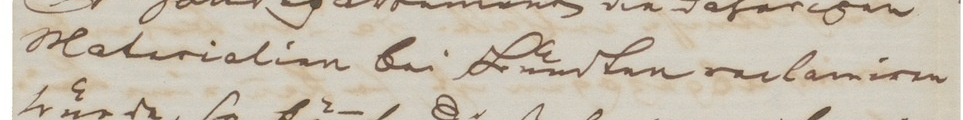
Materialien bei Bündten reclamiren
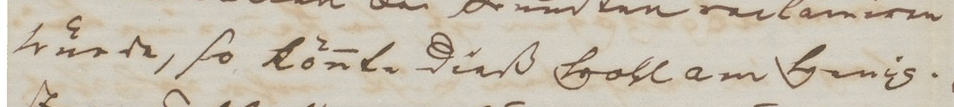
würde, so könnte dieß wohl am wenig-
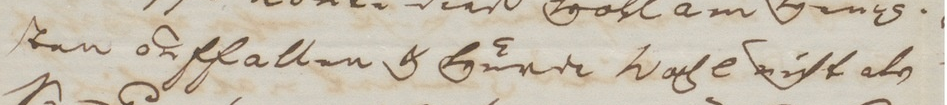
sten auffallen & würde wohl nicht als
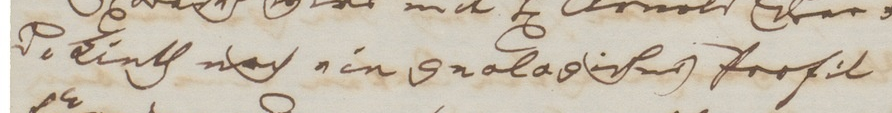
d. Linth noch ein geologisches Profil
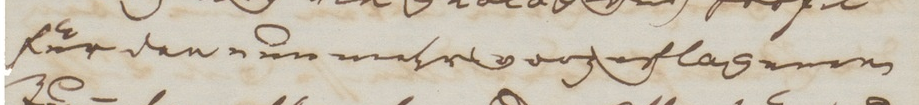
für den nunmehr vorgeschlagenen
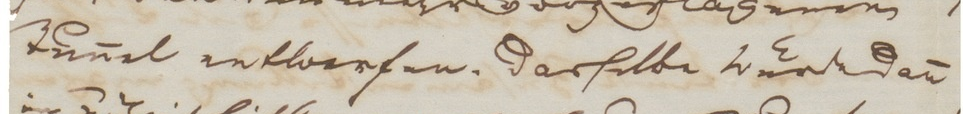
Tunnel entwerfen. Dasselbe würde dann
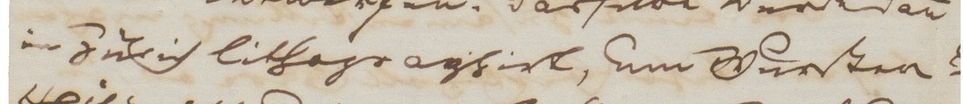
in Zürich lithographirt, um Wurster
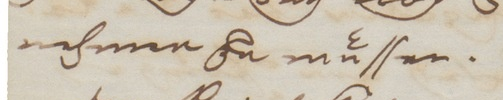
nehmen zu müssen.
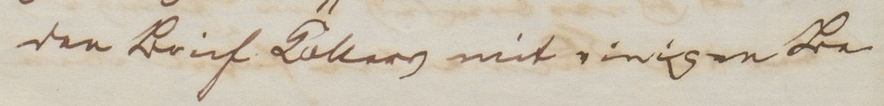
Den Brief Kollers mit einigen Be-
